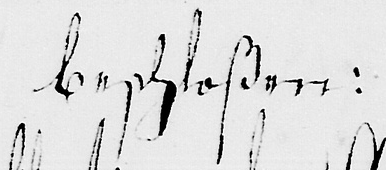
beschloßen:
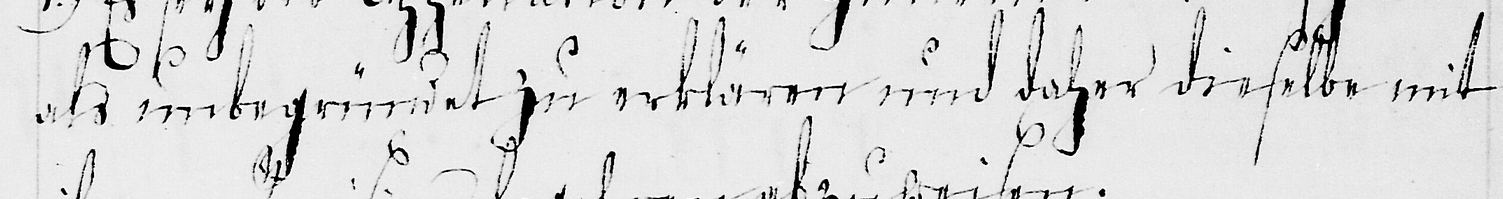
als unbegründet zu erklären und daher dieselbe mit
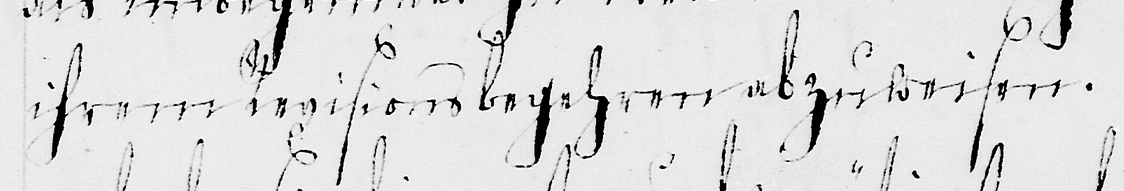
ihrem Revisionsbegehren abzuweisen.
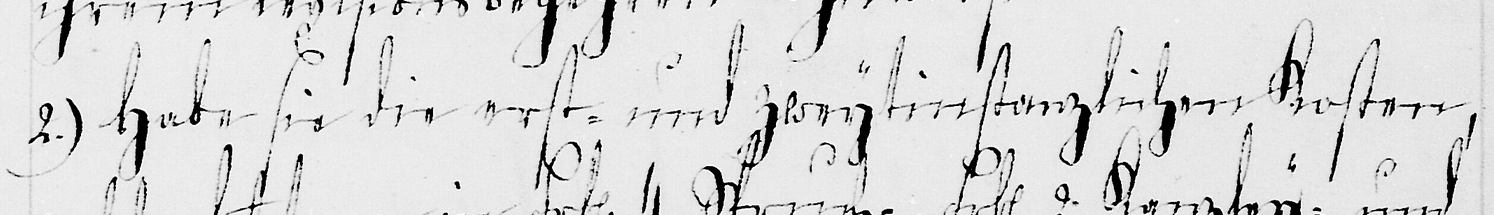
2.) Habe sie die erst- und zweytinstanzlichen Kosten,
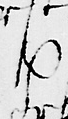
12.
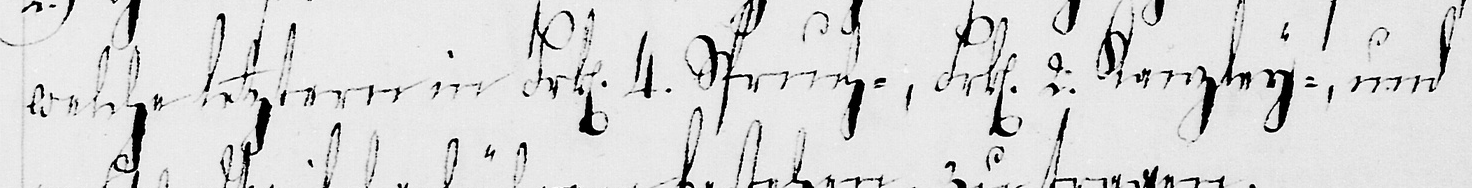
welche letztern in Frk[en]. 4. Spruch-, Frk[en]. 2. Kanzley-, und
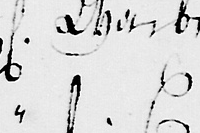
1.)
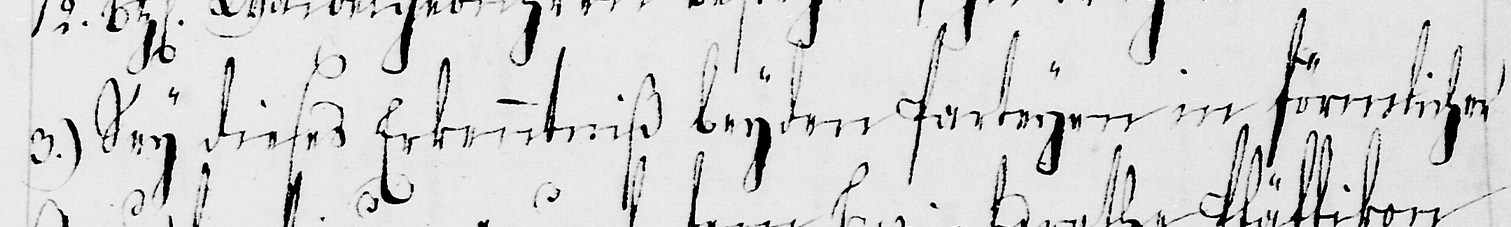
3.) Sey dieses Erkenntniß beyden Parteyen in förmlicher
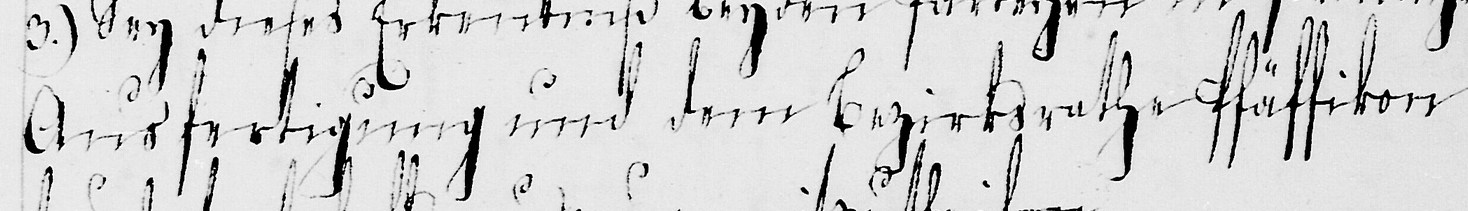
Ausfertigung und dem Bezirksrathe Pfäffikon
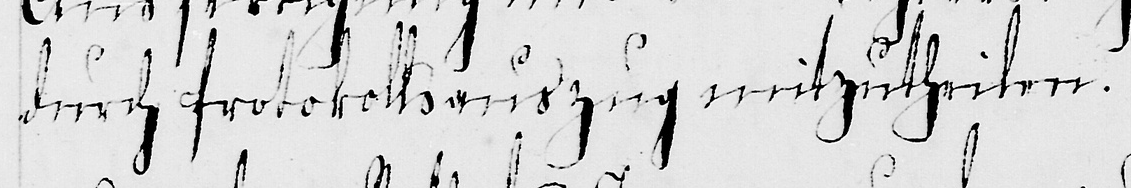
durch Protokollsauszug mitzutheilen.
